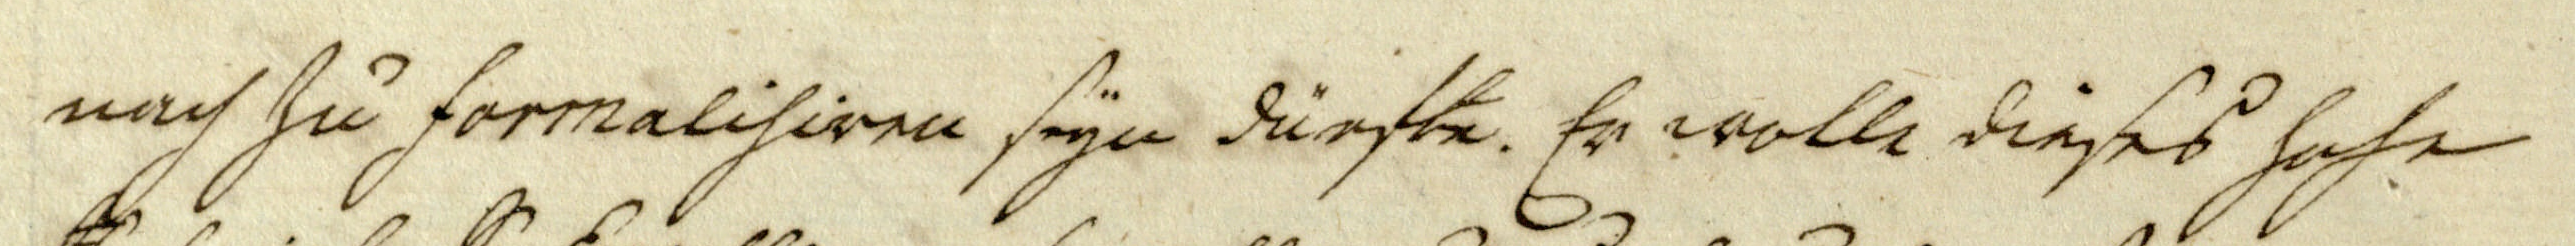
nach zu formalisiren seÿn dürfte. Er wolle dieses hohe
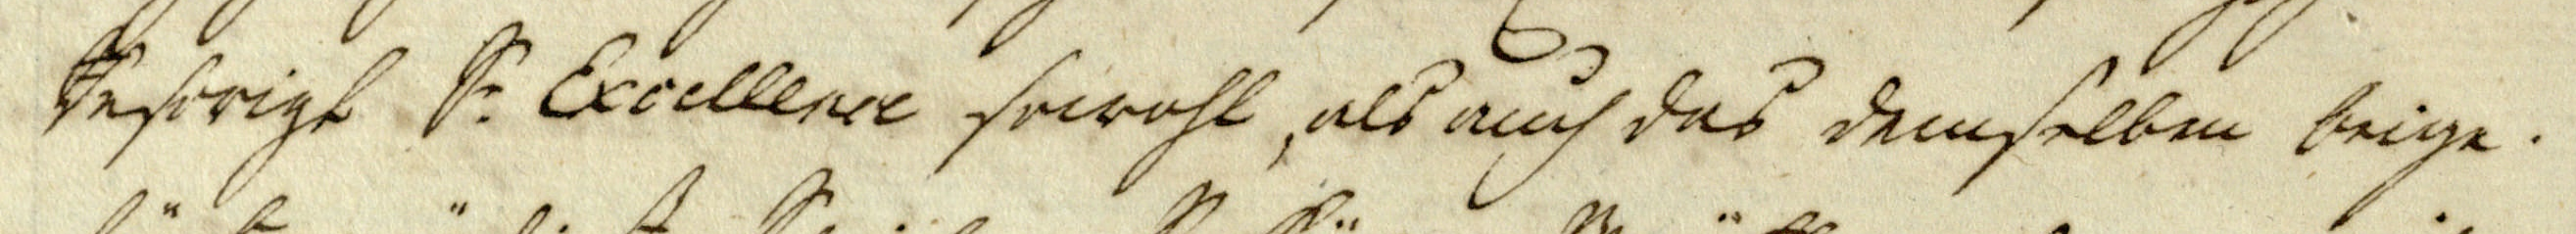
Rescript Sr. Excellence sowohl, als auch das demselben beige¬
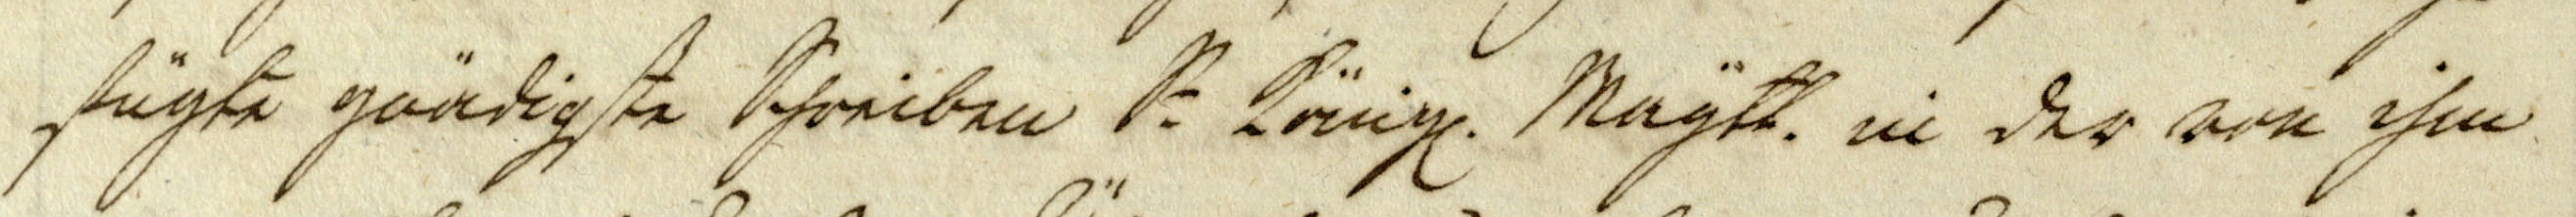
fügte gnädigste Schreiben Sr. Königl. Maÿtt. in der von ihm
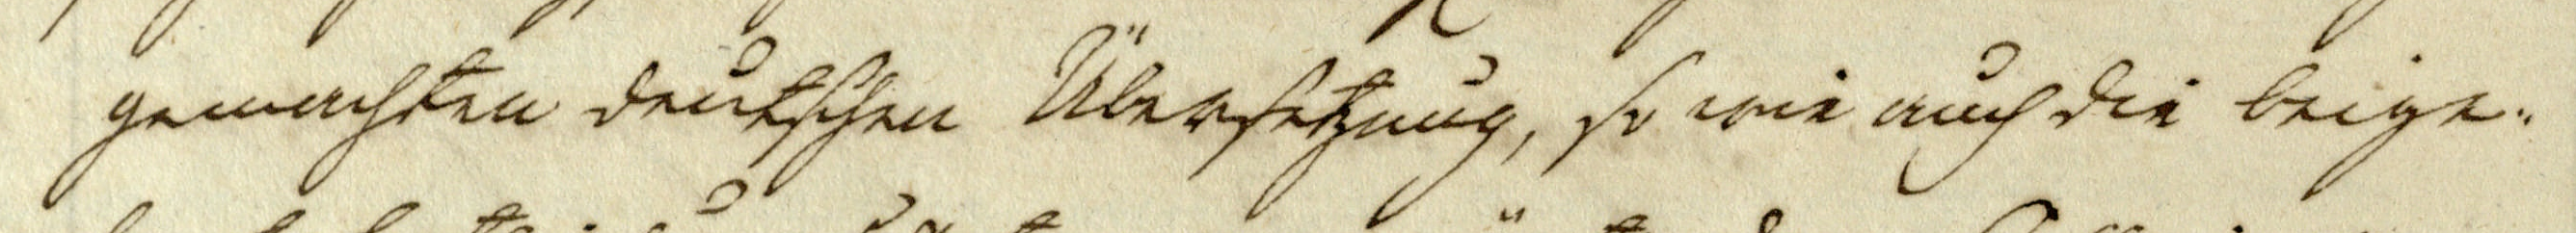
gemachten deutschen Übersetzung, so wie auch die beige¬
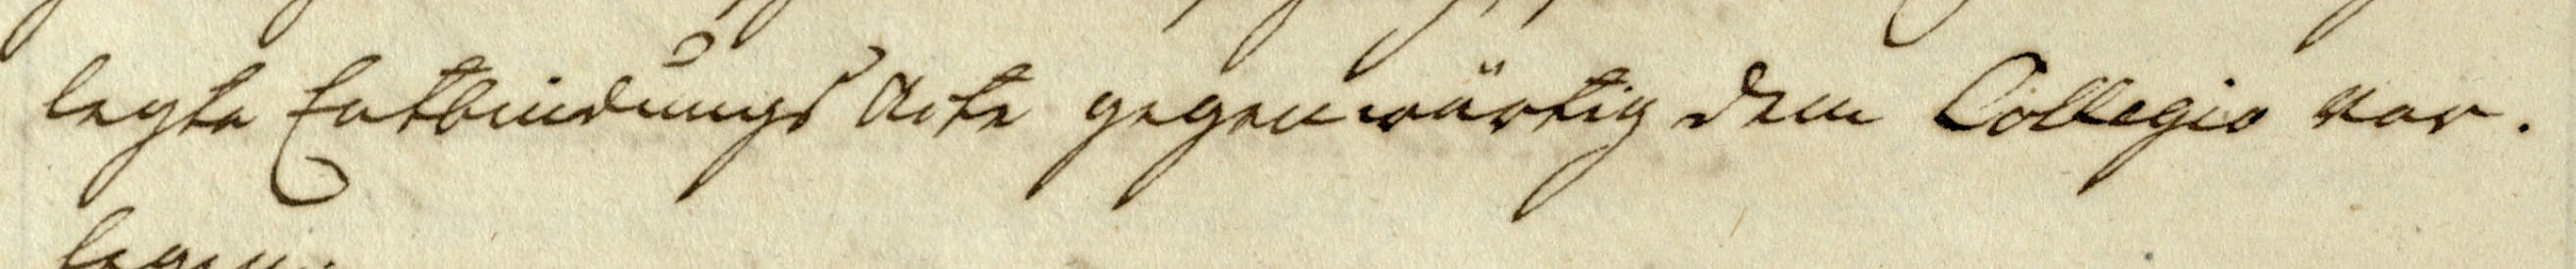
legte Entbindungs Acte gegenwärtig dem Collegio vor¬
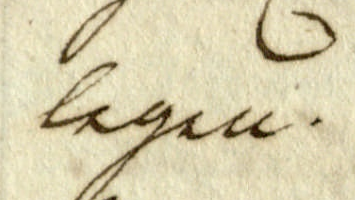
legen.
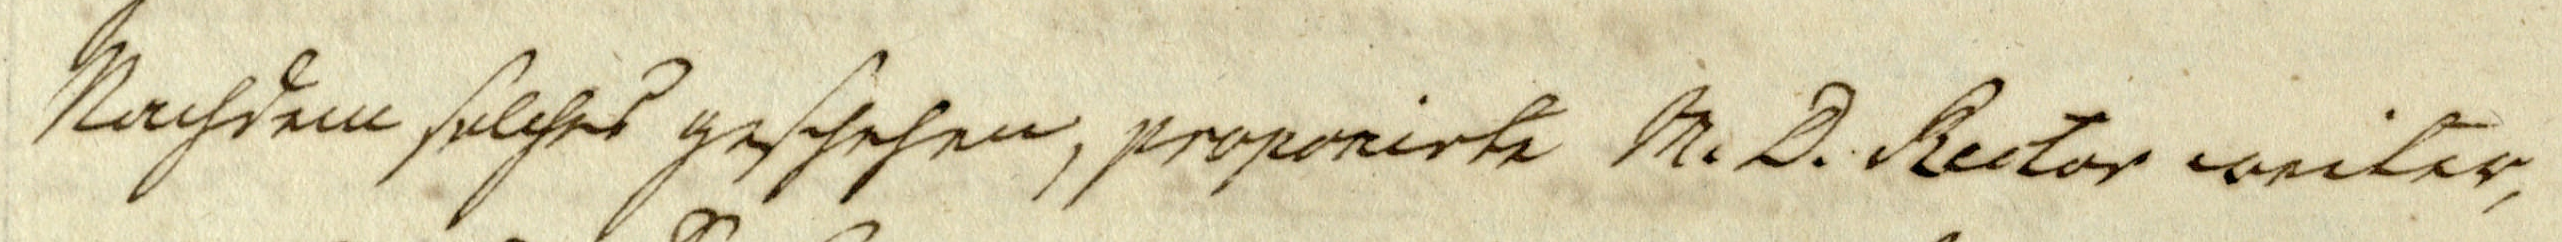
Nachdem solches geschehen, proponirte M. D. Rector weiter,
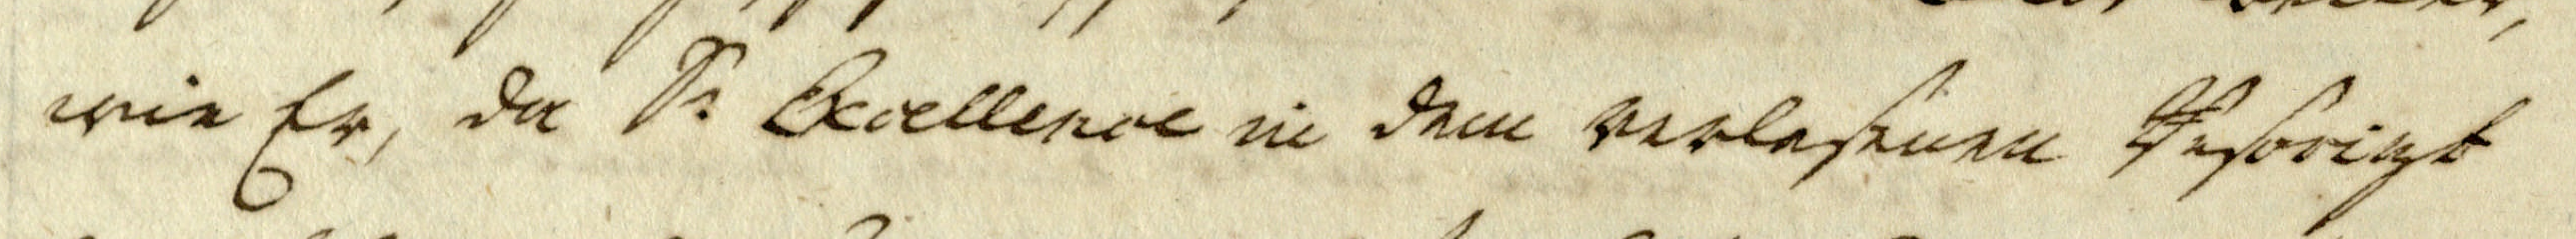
wie Er, da Sr. Excellence in dem verlesenen Rescript
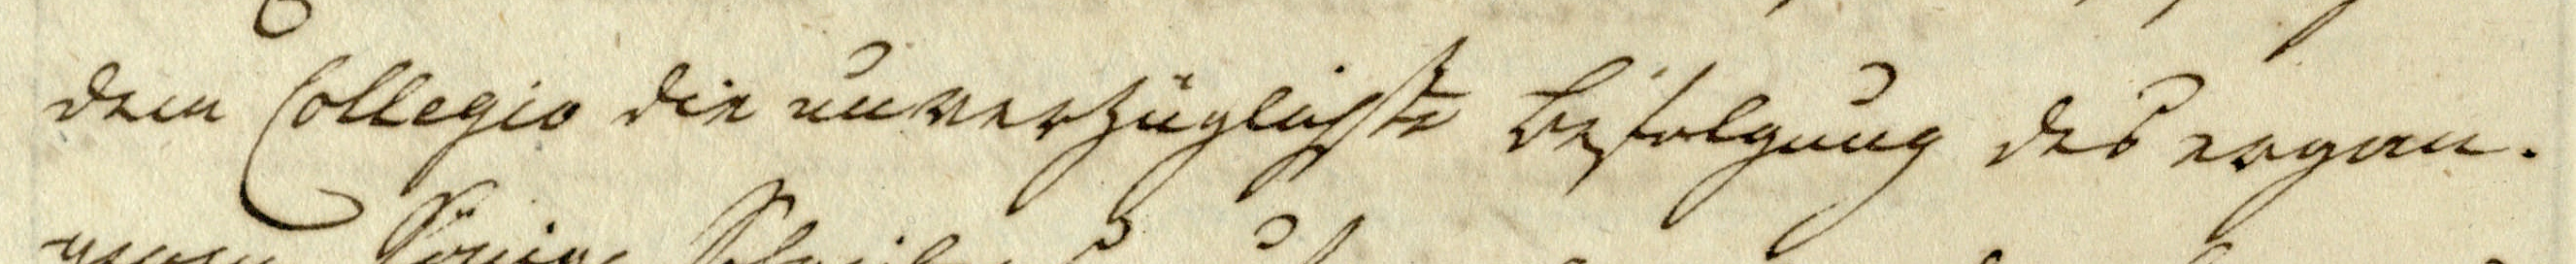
dem Collegio die unverzüglichste Befolgung des ergan¬
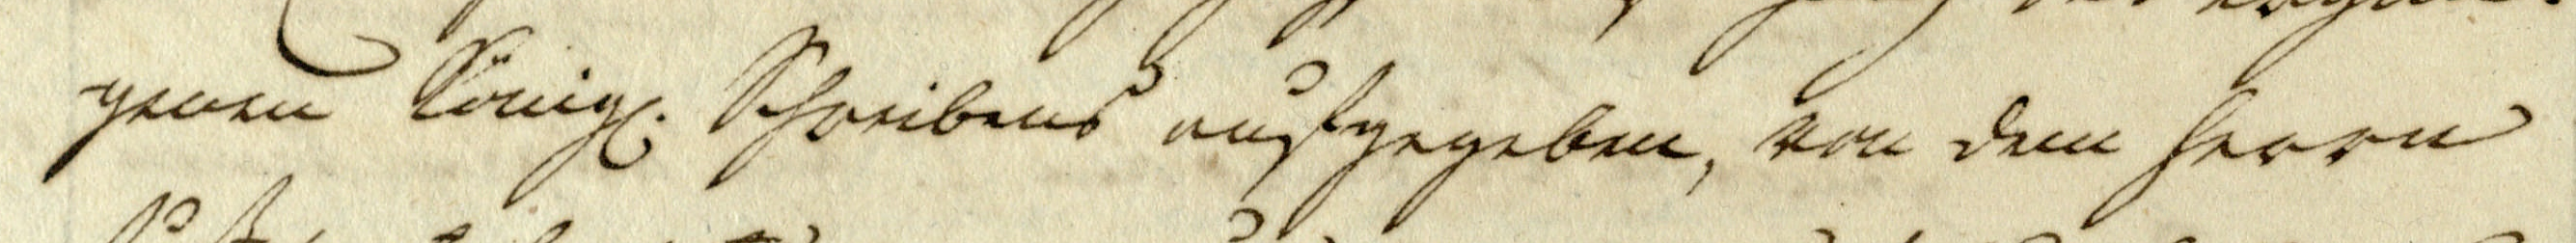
genen Königl. Schreibens aufgegeben, von dem herrn
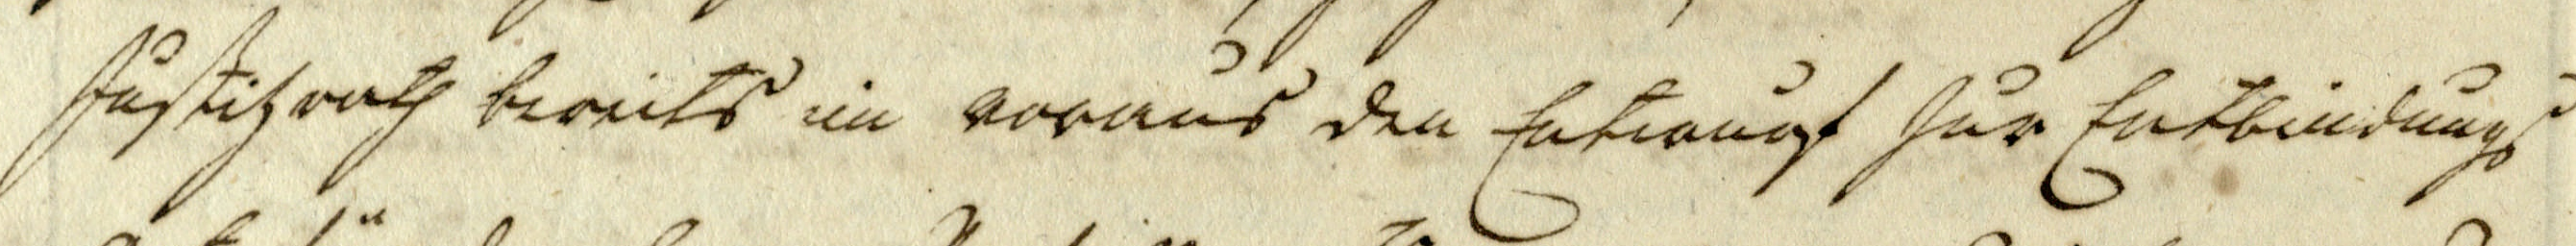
Justizrath bereits im voraus den Entwurf zur Entbindungs
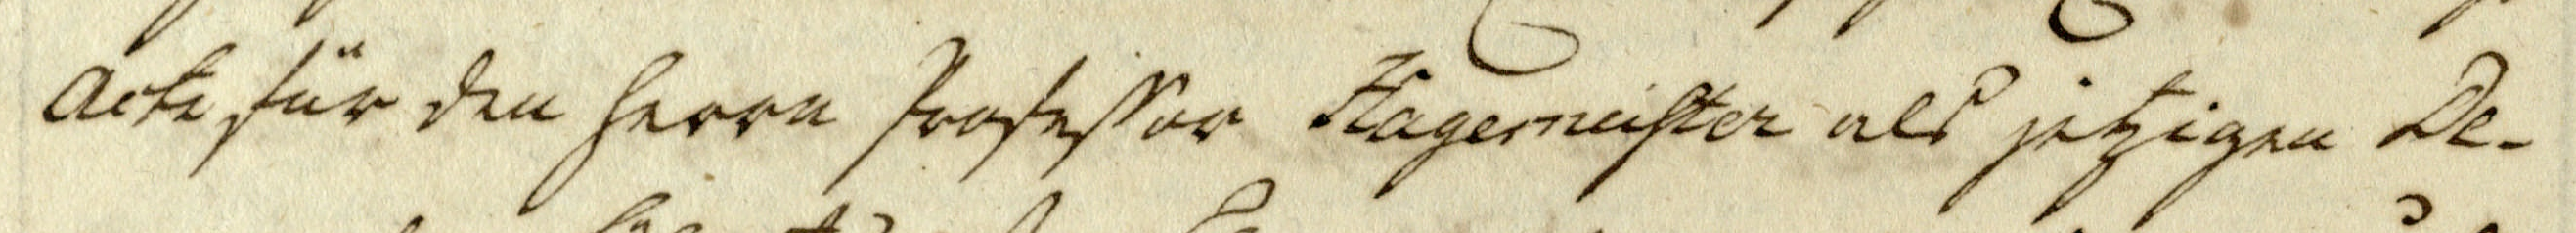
Acte für den herrn Professor Hagemeister als jetzigen De¬
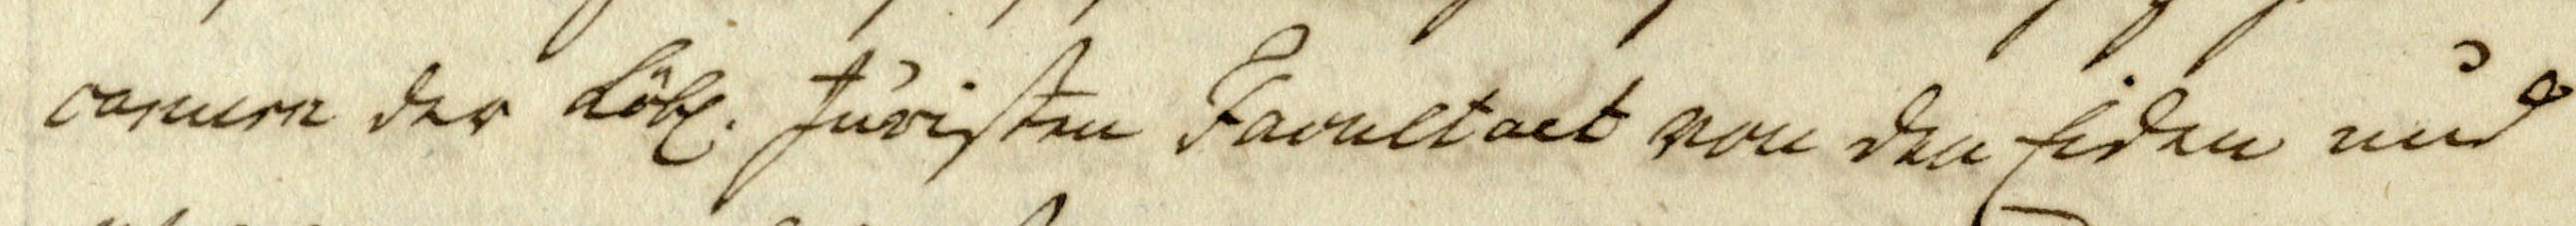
canum der Löbl. Juristen Facultaet von den Eiden und
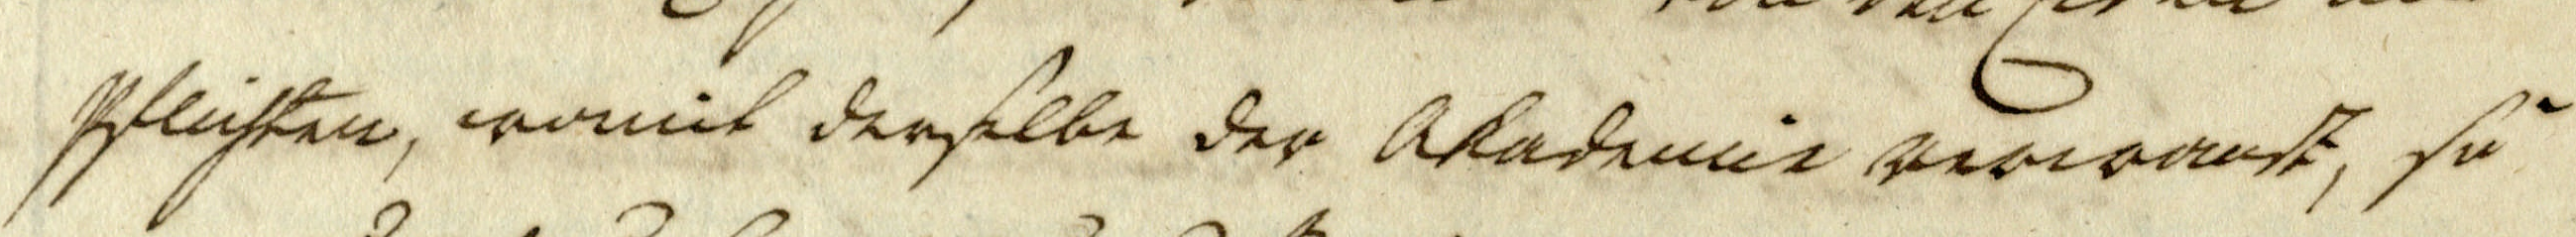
Pflichten, womit derselbe der Akademie verwandt, so
